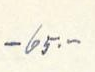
65
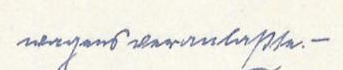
wagens veranlasste.
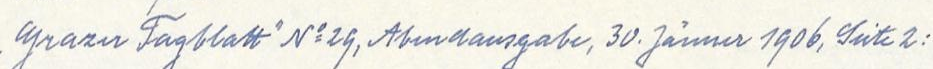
„Grazer Tagblatt“, Nr. 29, Abendausgabe, 30. Jänner 1906, Seite 2:
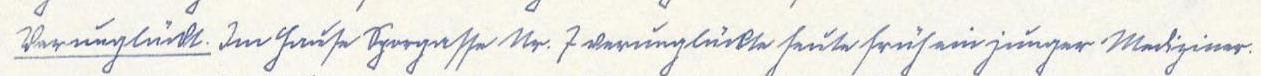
Verunglückt. Im Hause Sporgasse Nr. 7 verunglückte heute früh ein junger Mediziner.
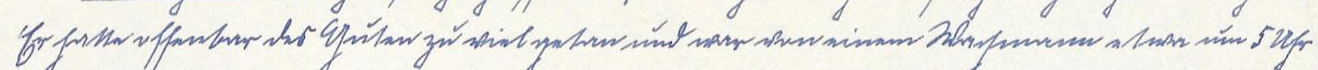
Er hatte offenbar des Guten zu viel getan und war von einem Wachmann etwa um 5 Uhr
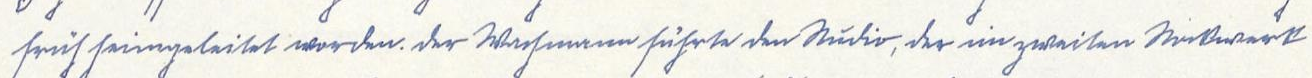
früh heimgeleitet worden. Der Wachmann führte den Studio, der im zweiten Stockwerk
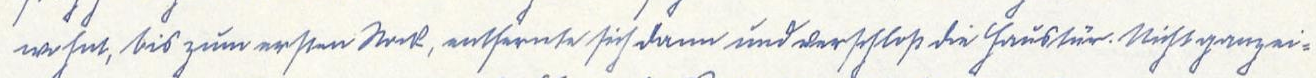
wohnt, bis zum ersten Stock, entfernte sich dann und verschloss die Haustür. Nicht ganz ei-
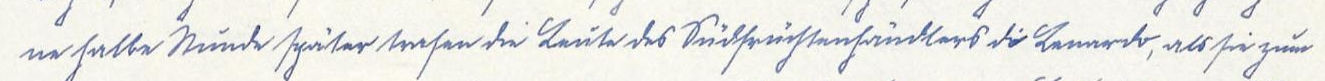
ne halbe Stunde später trafen die Leute des Südfrüchtenhändlers di Lenardo, als sie zum
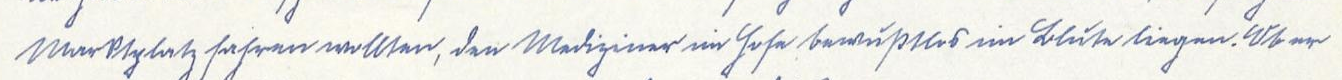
Marktplatz fahren wollten, den Mediziner im Hofe bewußtlos im Blute liegen. Ob er
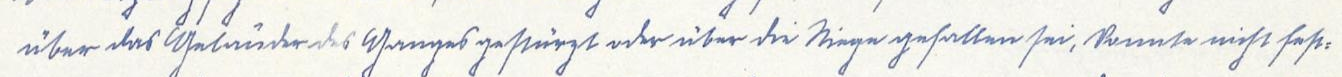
über das Geländer des Ganges gestürzt wurde über die Stiege gefallen sei, konnte nicht fest-
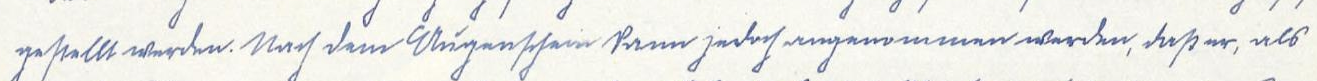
gestellt werden. Nach dem Augenschein kam jedoch angenommen werden, dass er, als
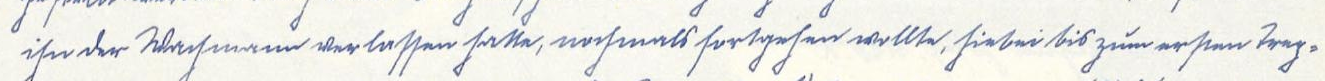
ihn der Wachmann verlassen hatte, nochmals fortgehen wollte, hierbei bis zum ersten Trep-
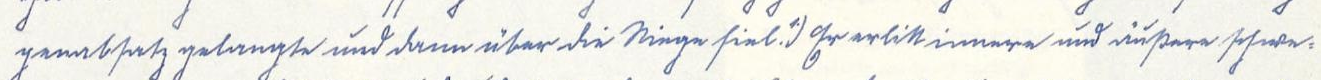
penabsatz gelangte und dann über die Stiege fiel.1) Er erlitt innere und äußere schwe-
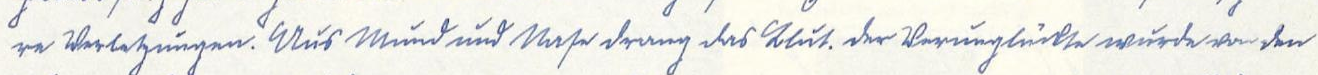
re Verletzungen. Aus Mund und Nase drang das Blut. Der Verunglückte wurde von den Leuten,
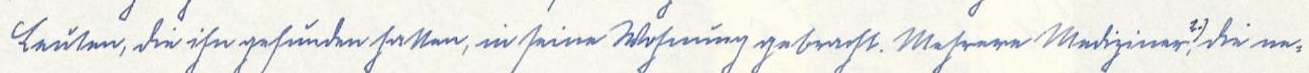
die ihn gefunden hatten, in seine Wohnung gebracht. Mehrere Mediziner 2), die ne-
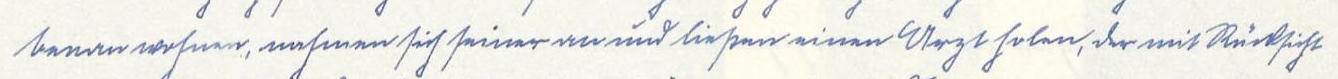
benan wohnen, nahmen sich seiner an und ließen einen Arzt holen, der mit Rücksicht
